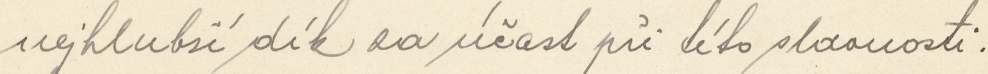nejhlubší dík za účast při této slavnosti.
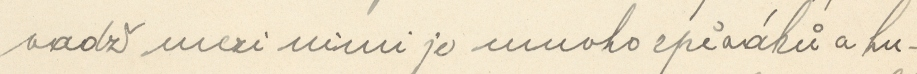vadž mezi nimi je mnoho zpěváků a hu-
